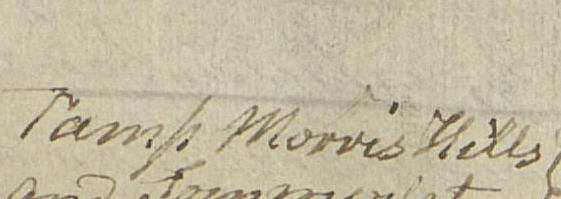Camp Morris Hills
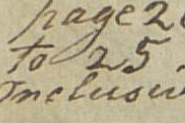to 25
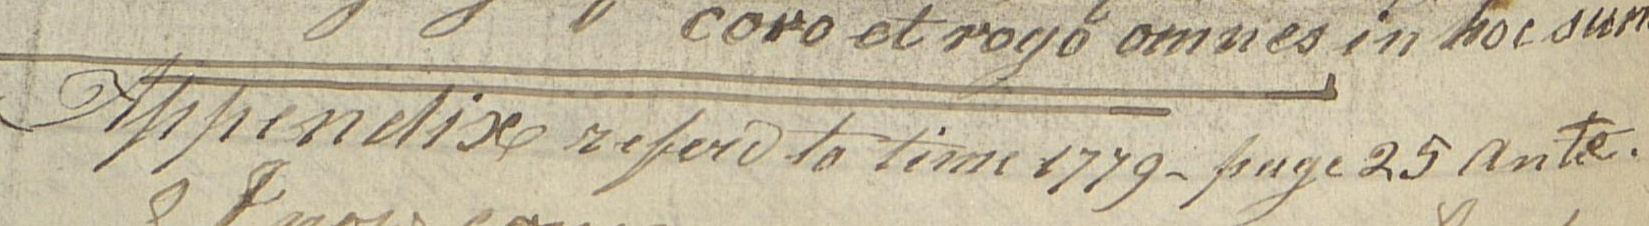Appendix referd to time 1779- page 25 ante
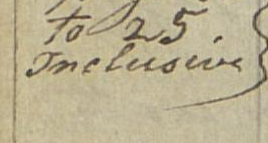Inclusive
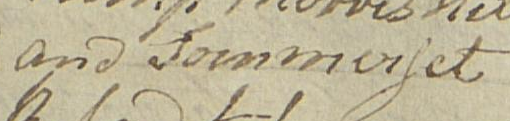and Sommerset
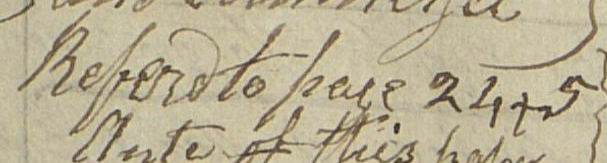Referd to page 24 + 5
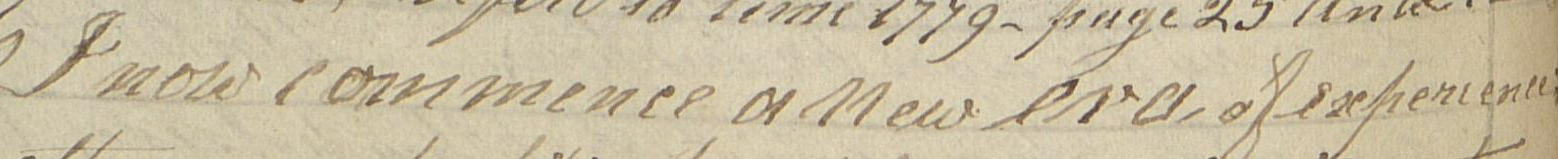I now commence a New era of experience;
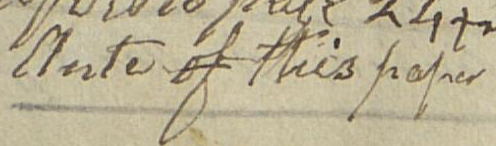Ante of this paper
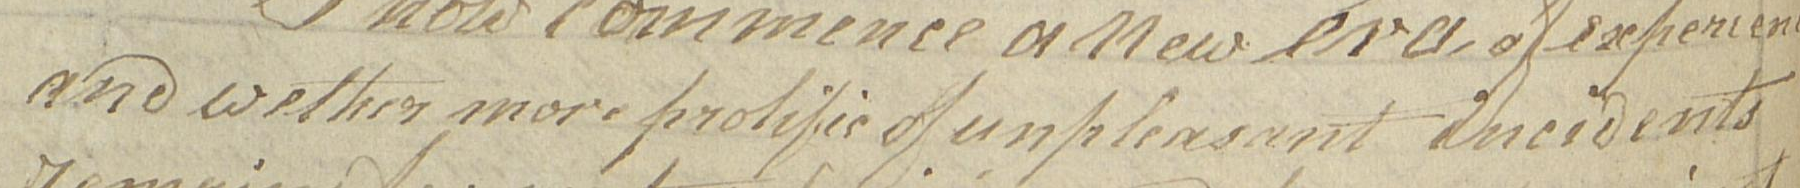and wethor more prolific of unpleasant Incidents
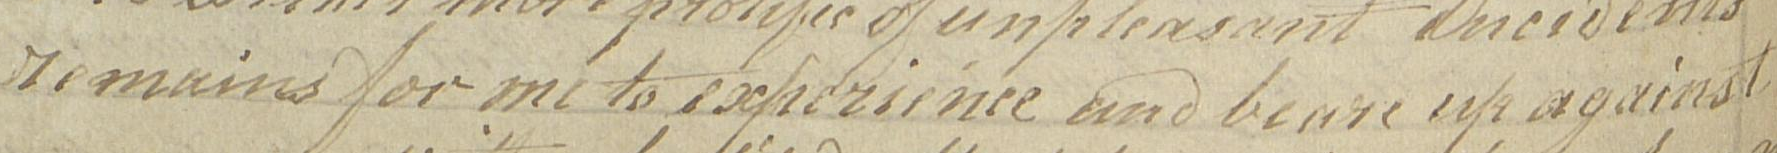remains for me to experience and beare up against
